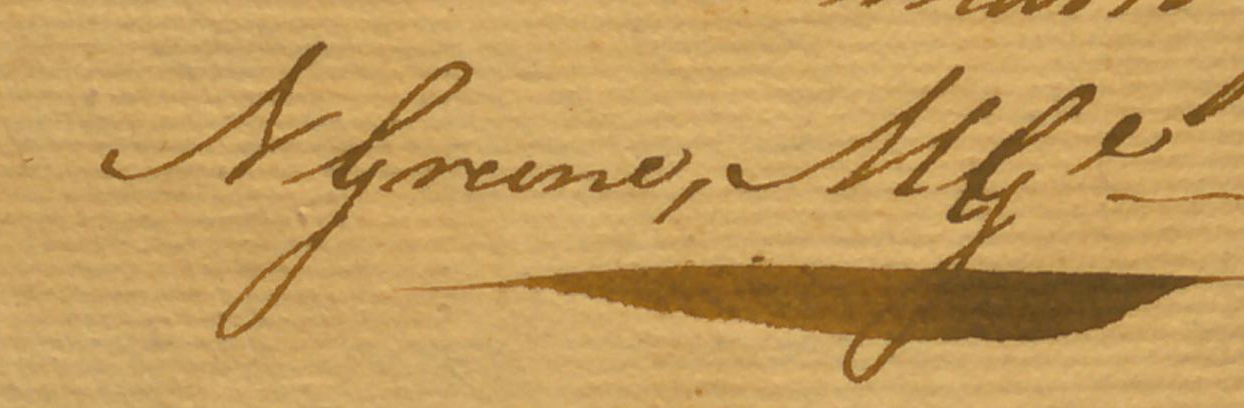N Greene, MG^l
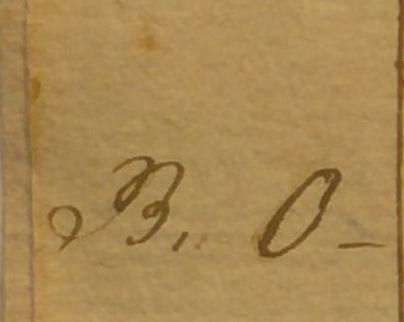B. O-
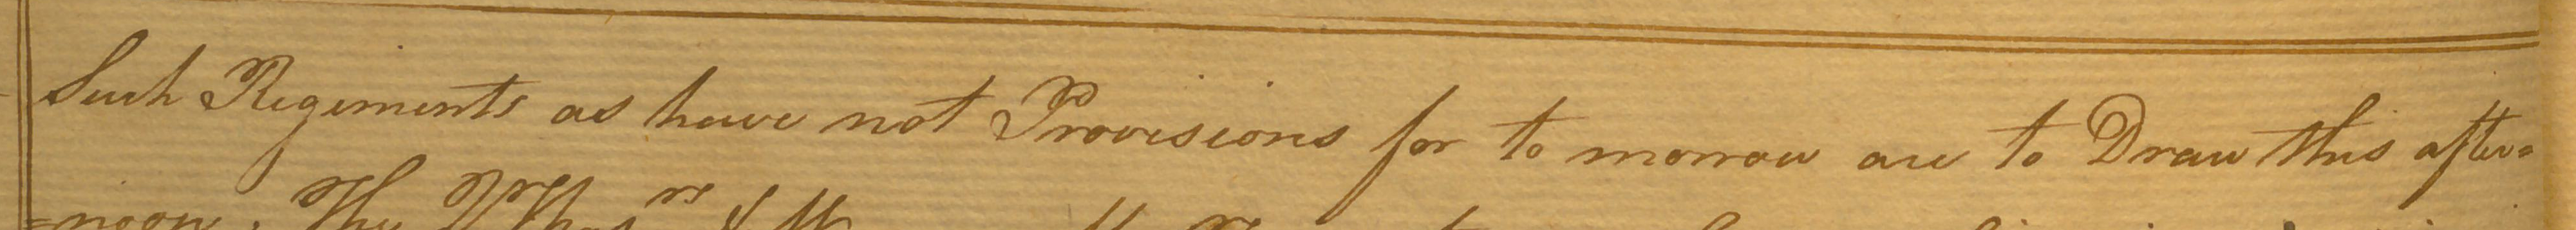Such Regiments as have not Provisions for to morrow are to Draw this after-
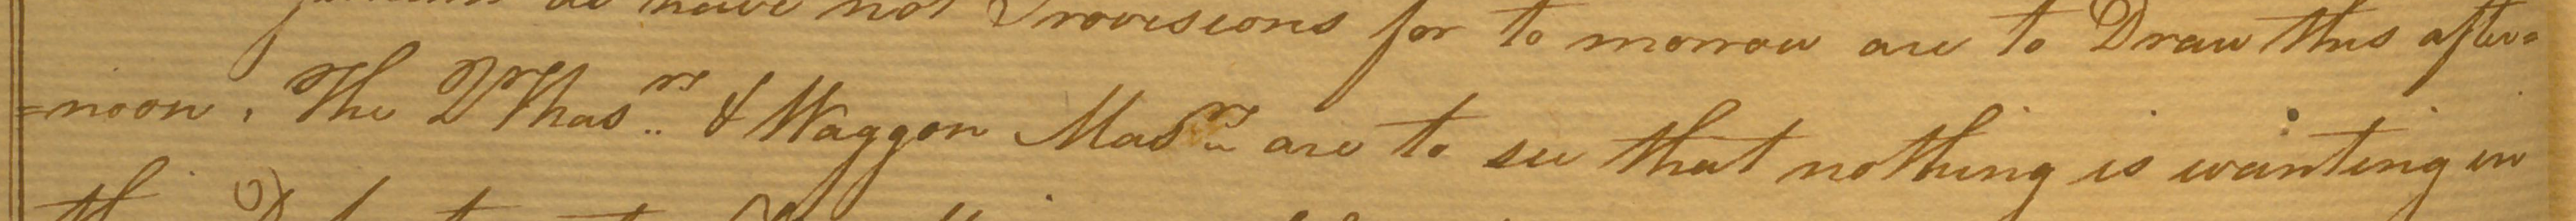-noon. The Q^r Mas^rs. & Waggon Mas^rs. are to see that nothing is wanting in
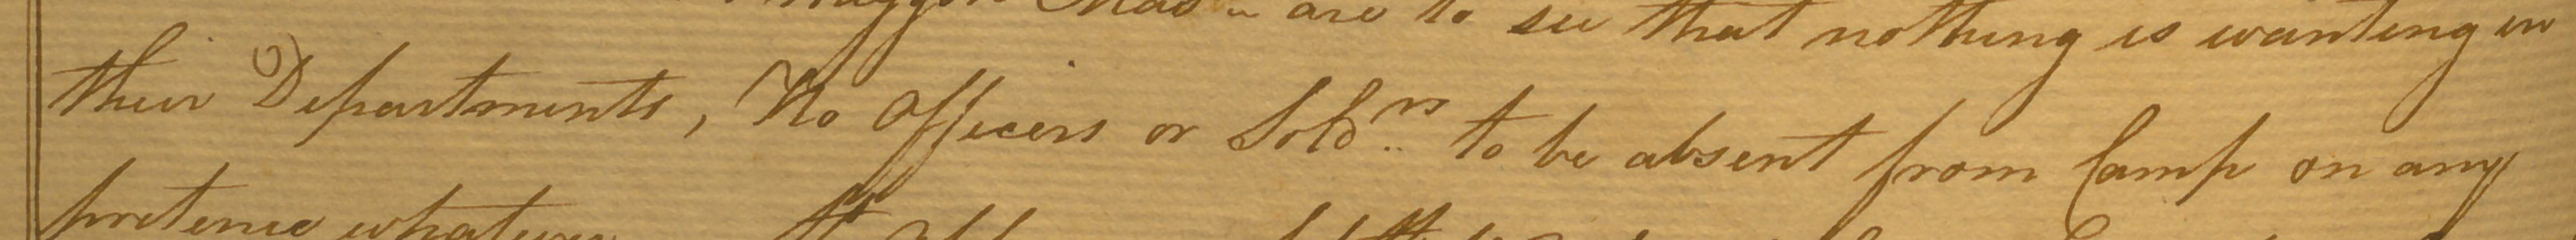their Departments, no officers or Sold^rs. to be absent from Camp or any
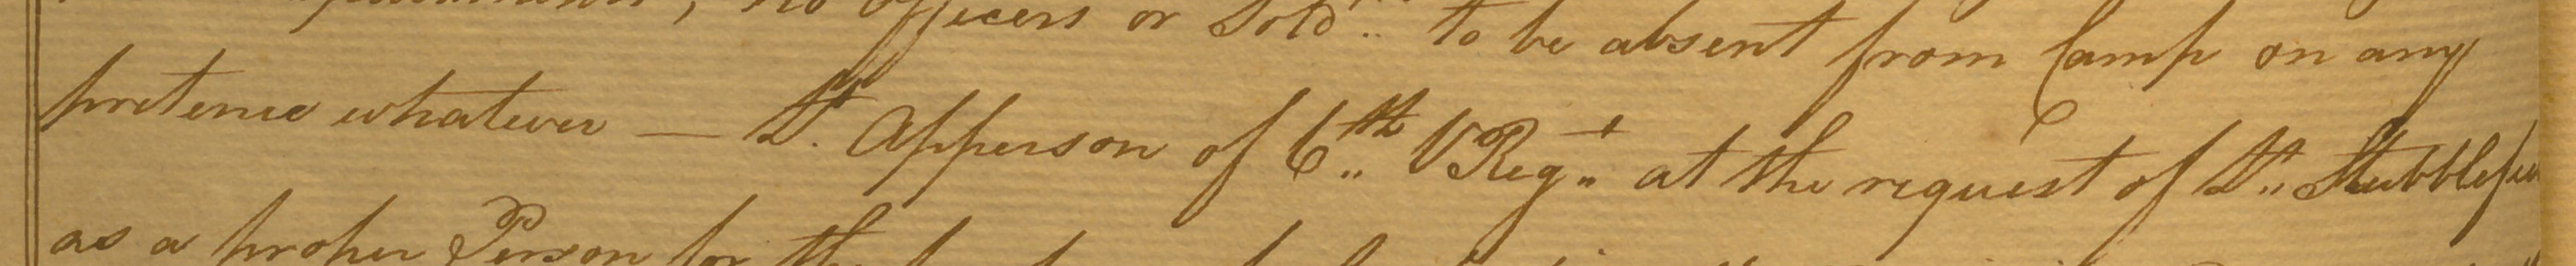pretense whatever- L^t. Apperson of 6^th. V Reg^t. at the request of L^t. Stubblefield
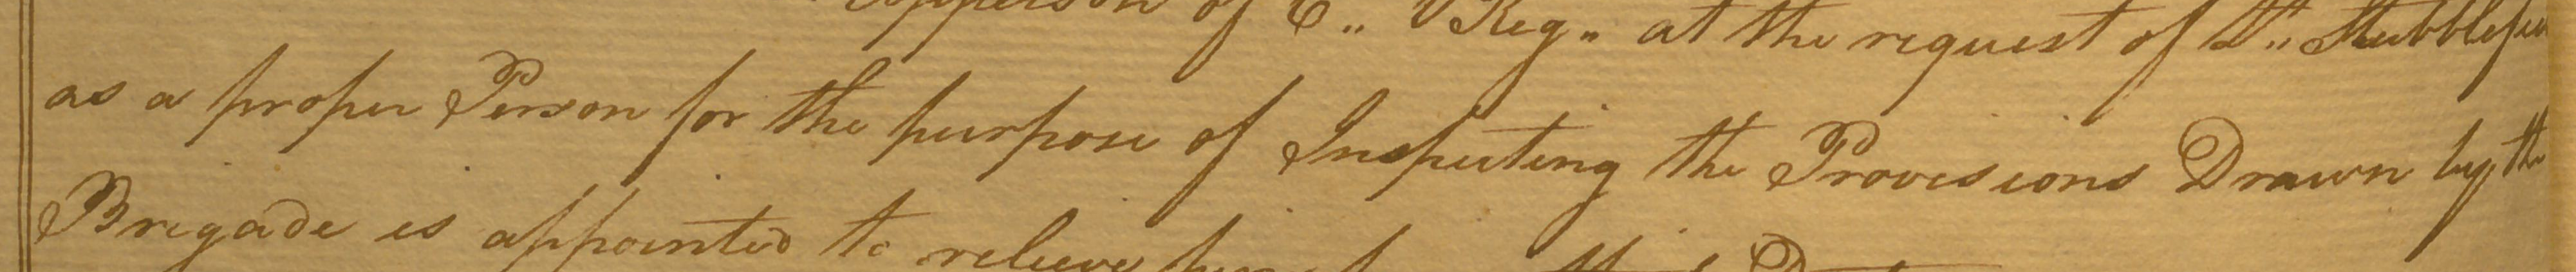as a proper Person for the purpose of Inspecting the Provisions Drawn by the
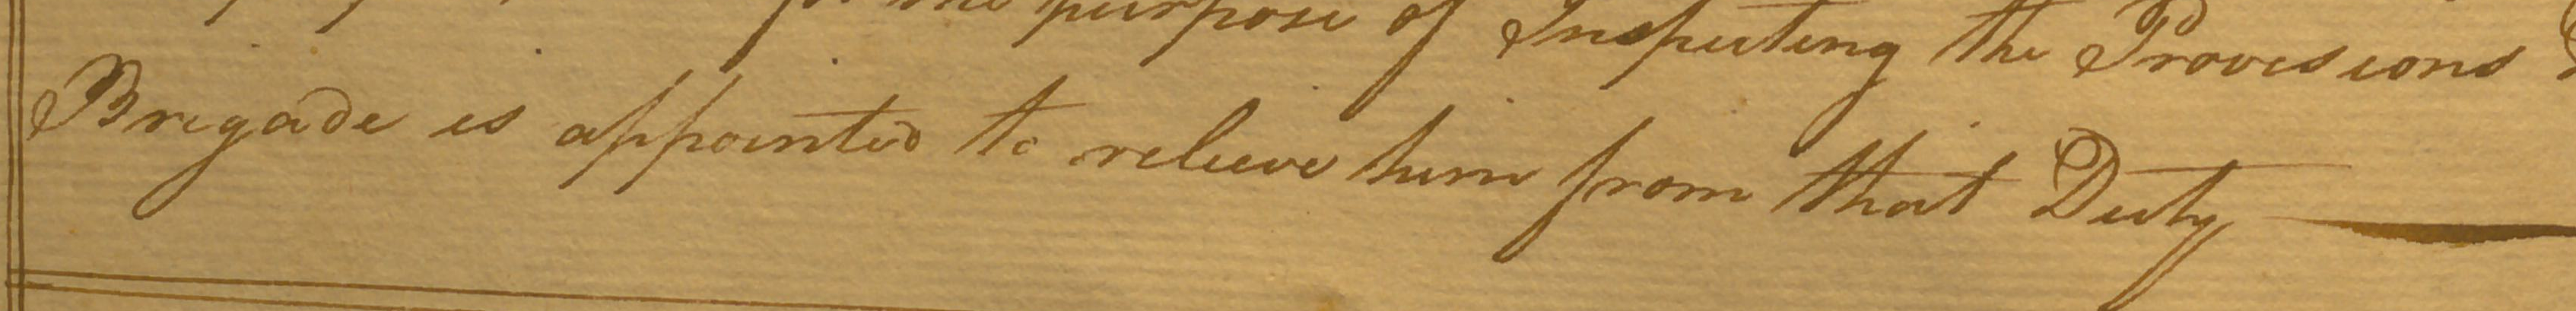Brigade is appointed to relieve him from that Duty-
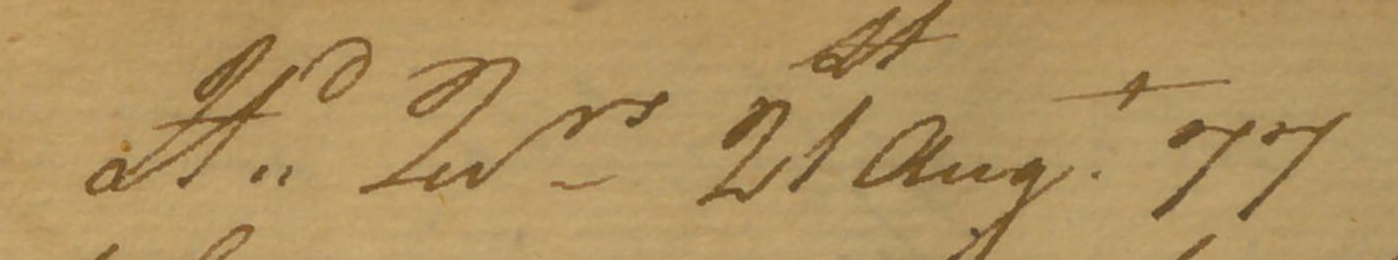H^d. Qu^rs. 21^st Aug^t. 77
